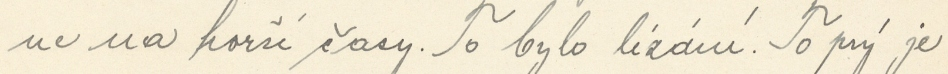ne na horší časy. To bylo lízání. To prý je
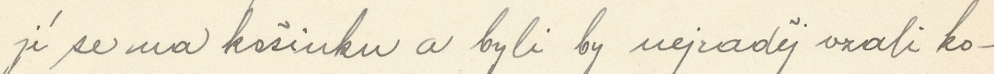jí se na košinku a byli by nejraděj vzali ko-
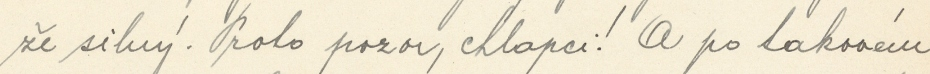že silný. Proto pozor, chlapci! A po takovém
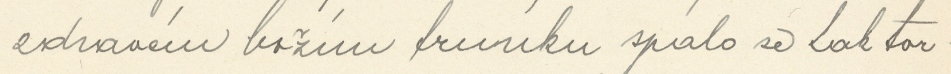zdravém božím trunku spalo se tak tvr-
